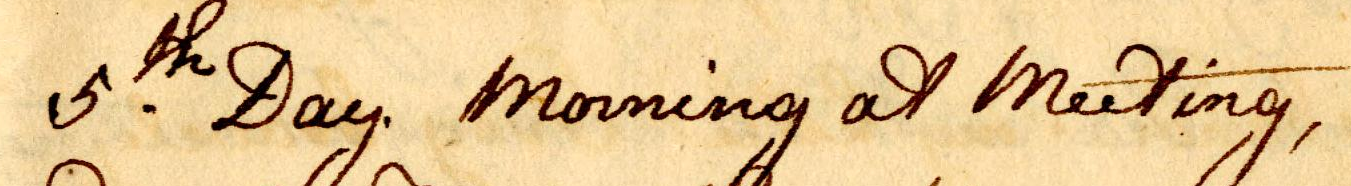5^th Day. Morning at Meeting,
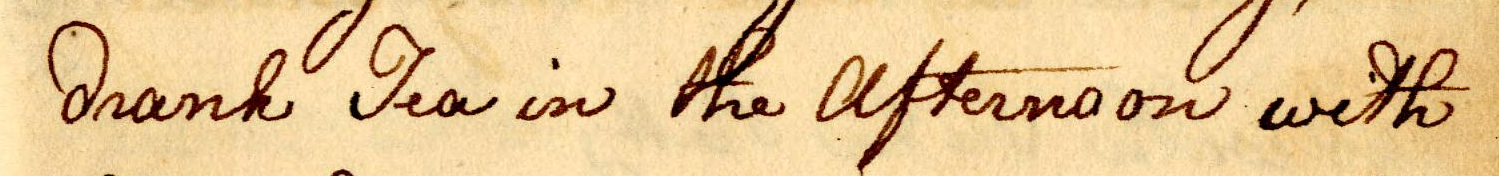drank Tea in the Afternoon with
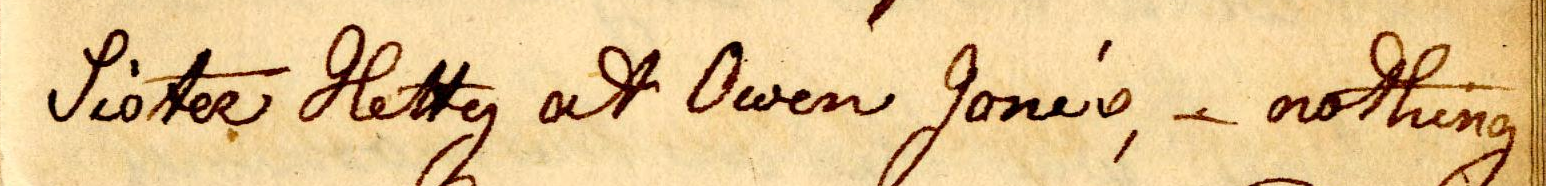Sister Hetty at Owen Jone's,- nothing
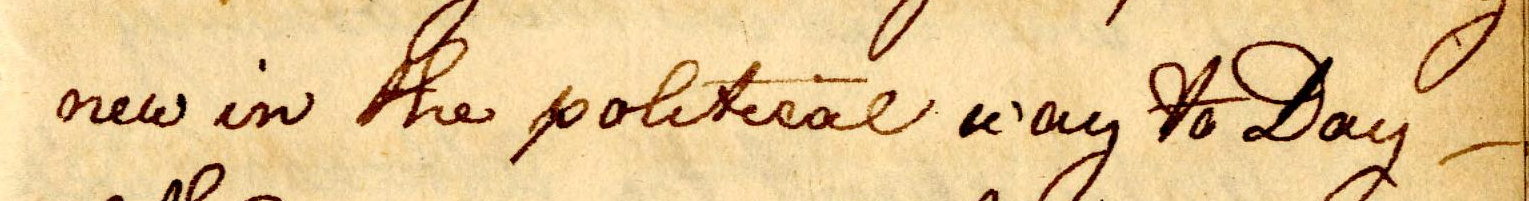new in the political way to Day-
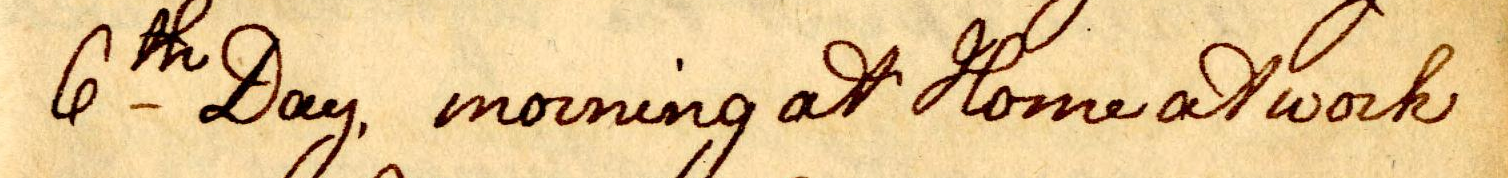6^th Day, morning at Home at work
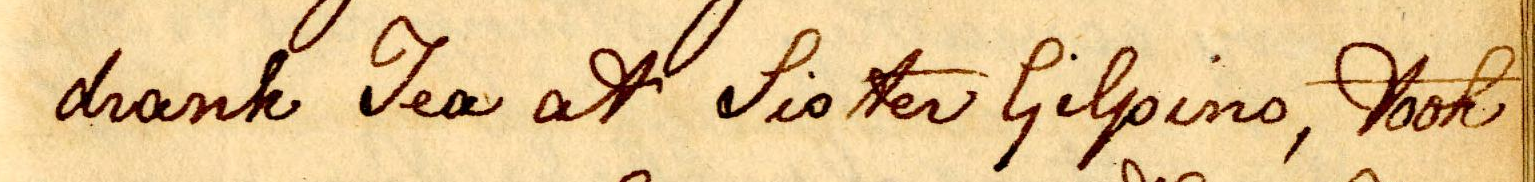drank Tea at Sister Gilpins, took
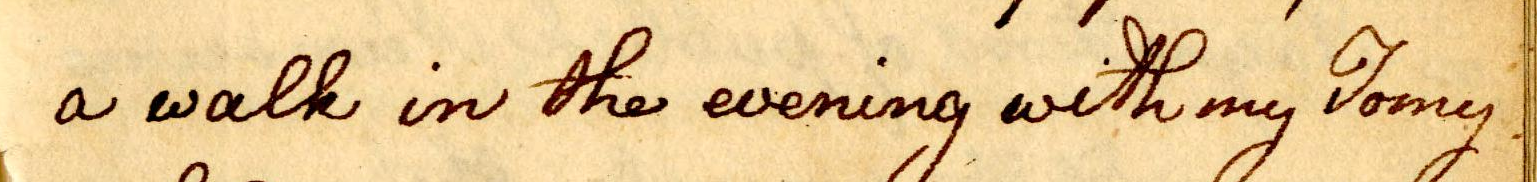a walk in the evening with my Tomy
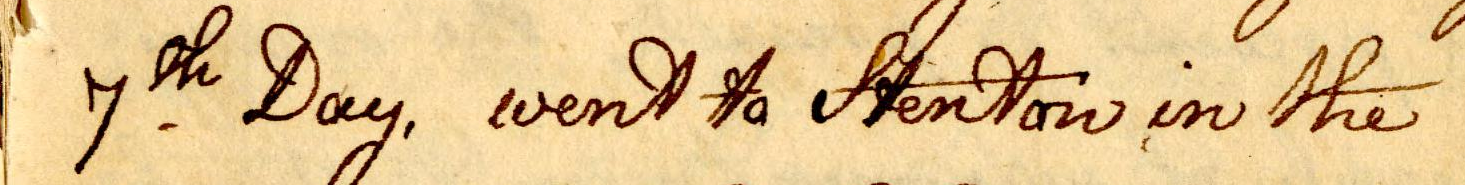7^th Day, went to Stenton in the
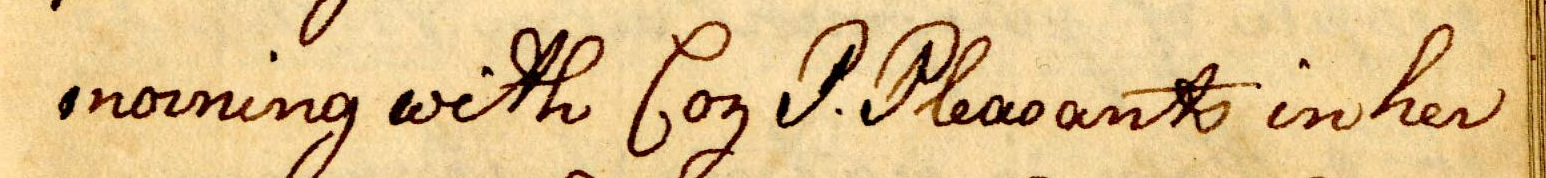morning with Coz P. Pleasants in her
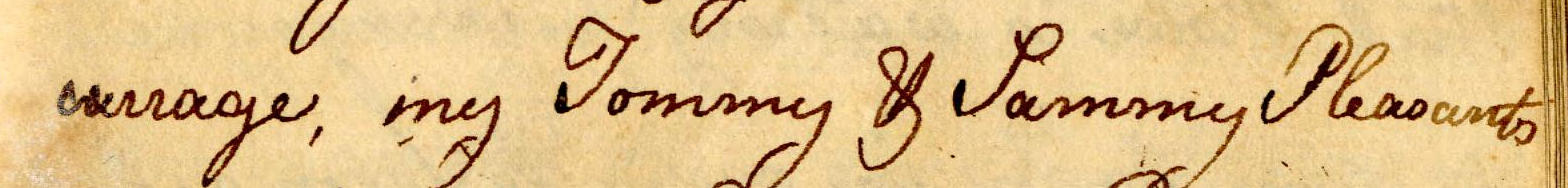carrage, my Tommy & Sammy Pleasants
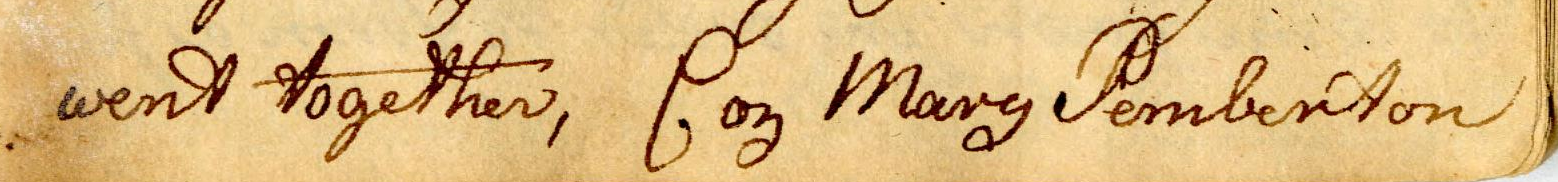went together, Coz Mary Pemberton
